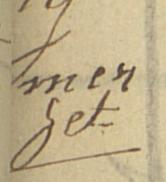-mer
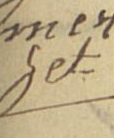get
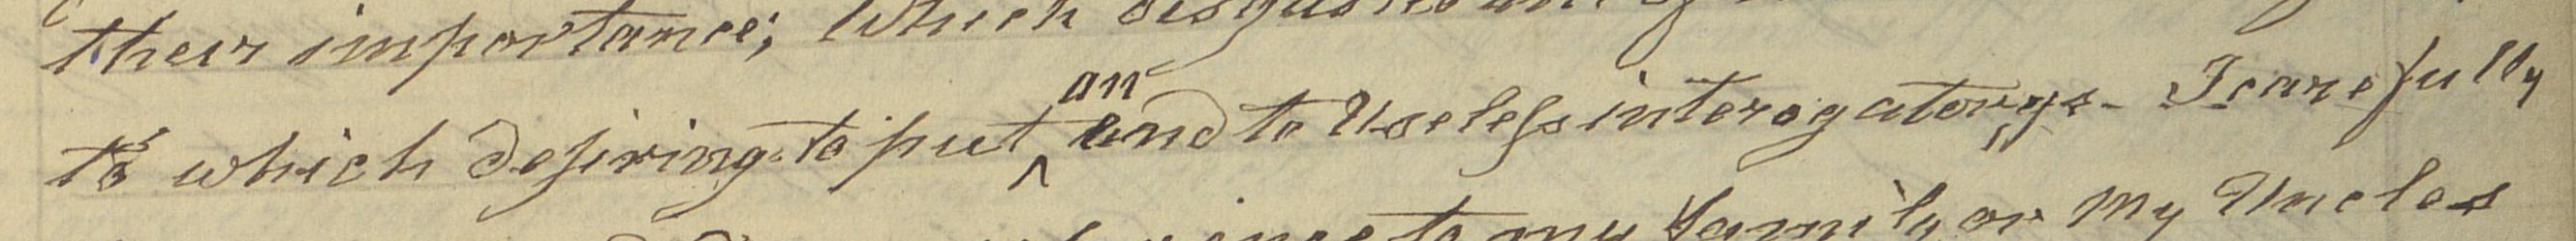to which desiring to put ^ end to Useless interogatory I carefully
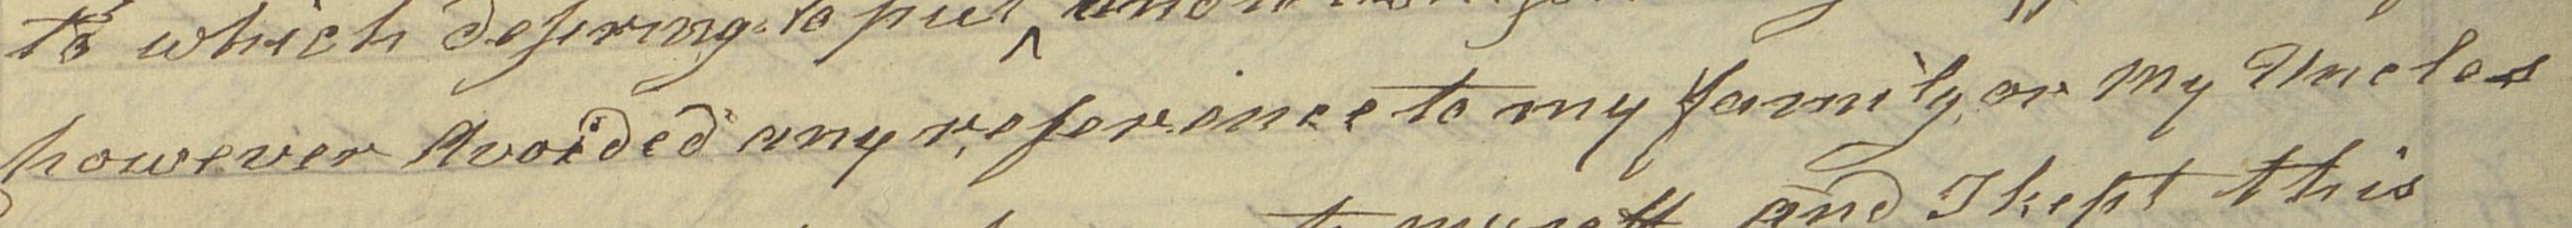however avoided my reference to my family or My Uncles
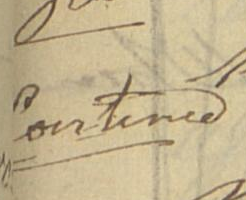Contend
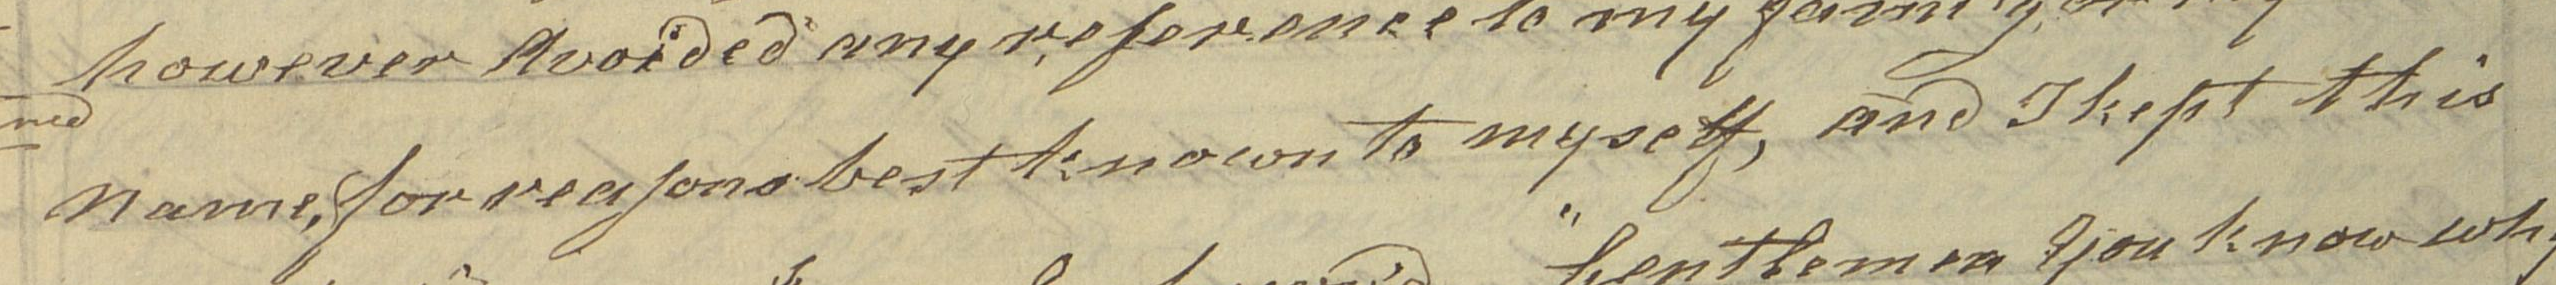name for reasons best known to myself, and I kept this
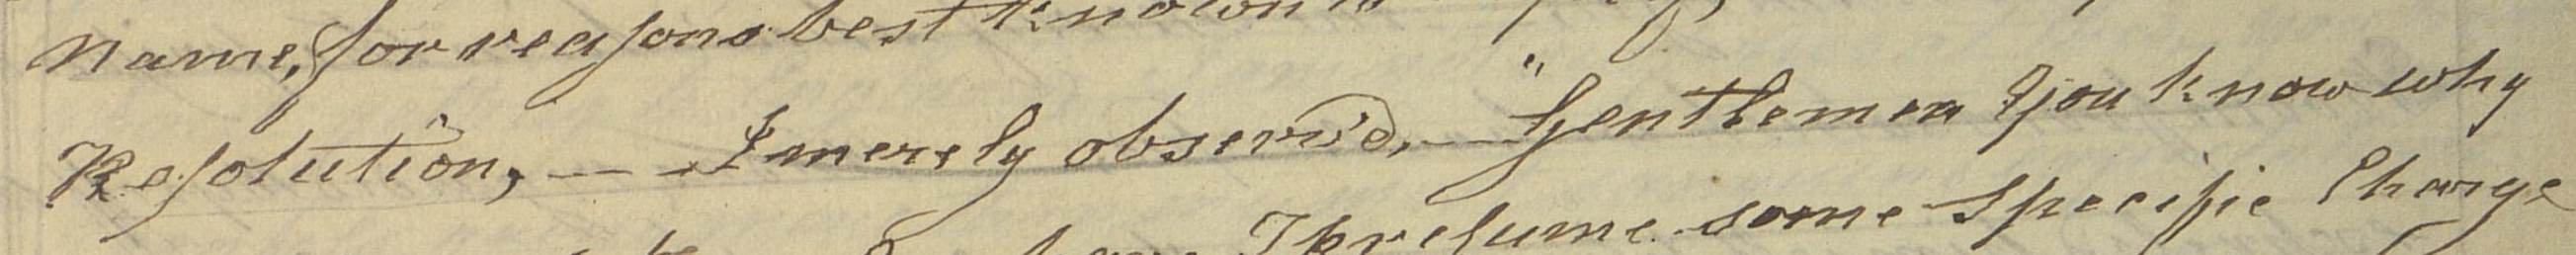Resolution, I merely observe'd. Gentlemen You know why
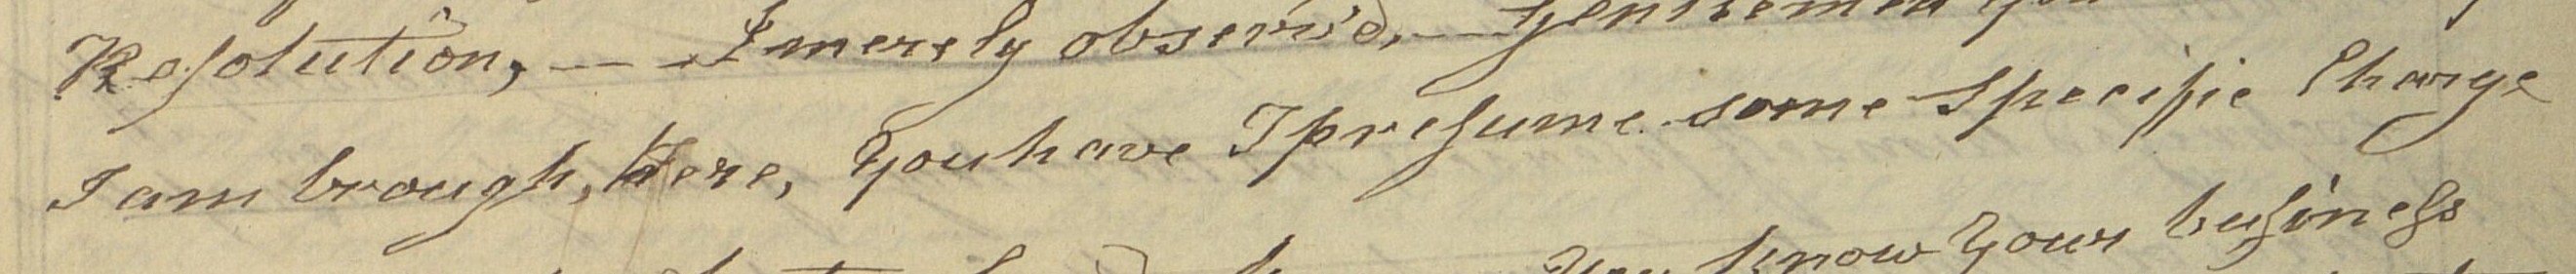I am brough, Here, You have I presume some Sperific Charge
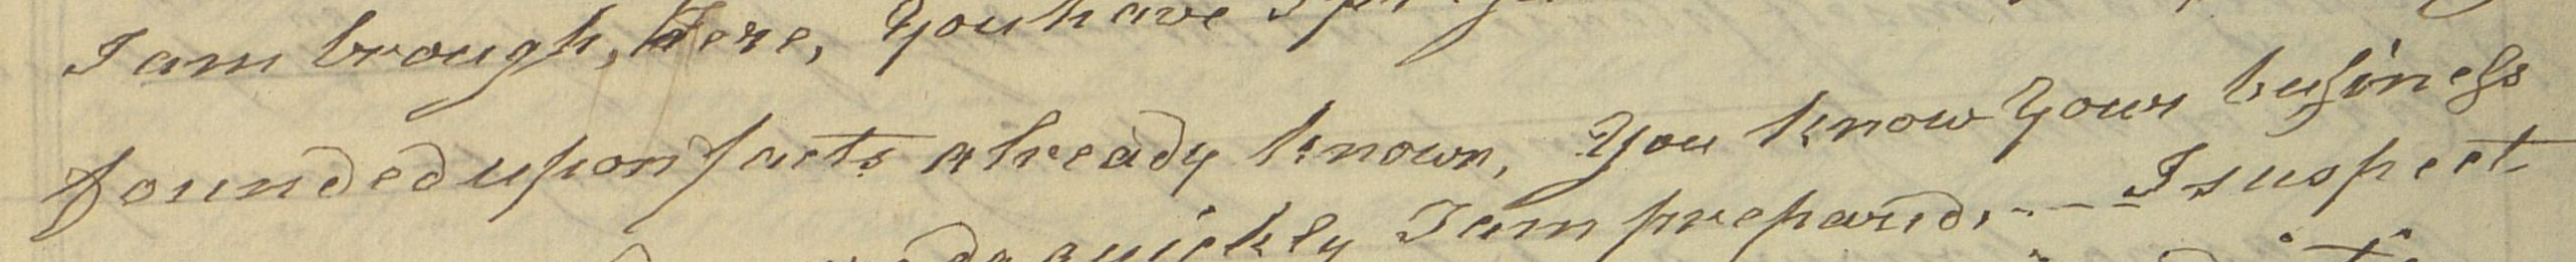founded upon facts already known, You know your business
